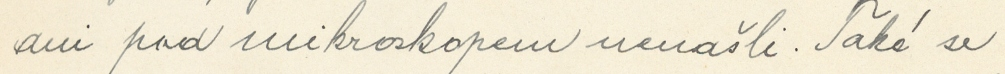ani pod mikroskopem nenašli. Také se
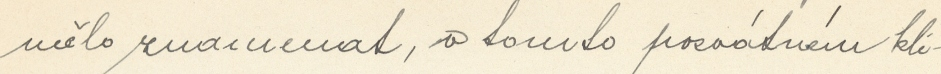mělo znamenat, v tomto posvátném kli-
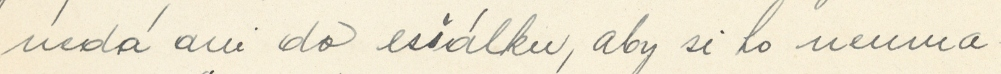nedá ani do esšálku, aby si ho neuma-
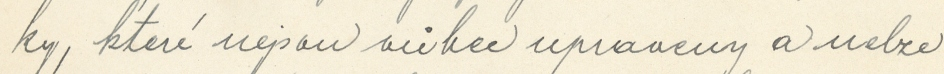ky, které nejsou vůbec upraveny a nelze
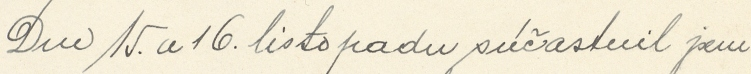Dne 15. a 16. listopadu súčastnil jsem
